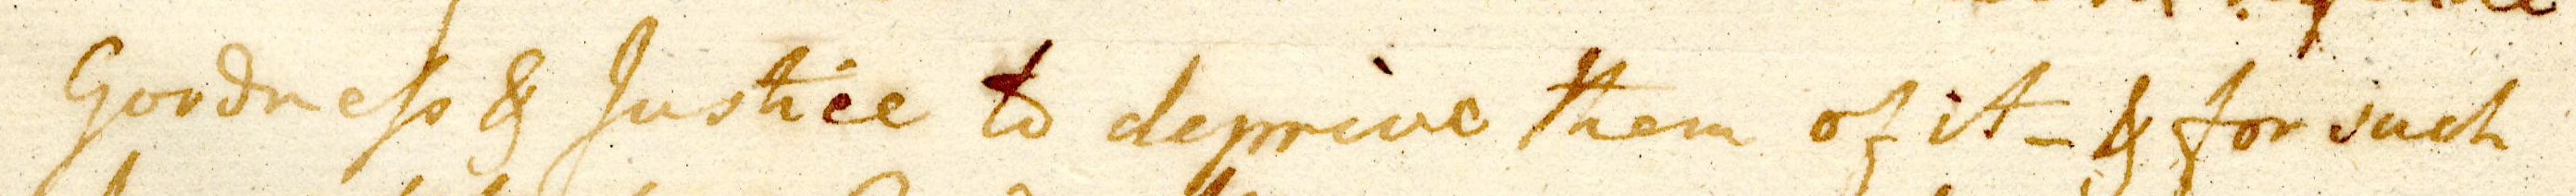Goodness & Justice to deprive them of it- & for such
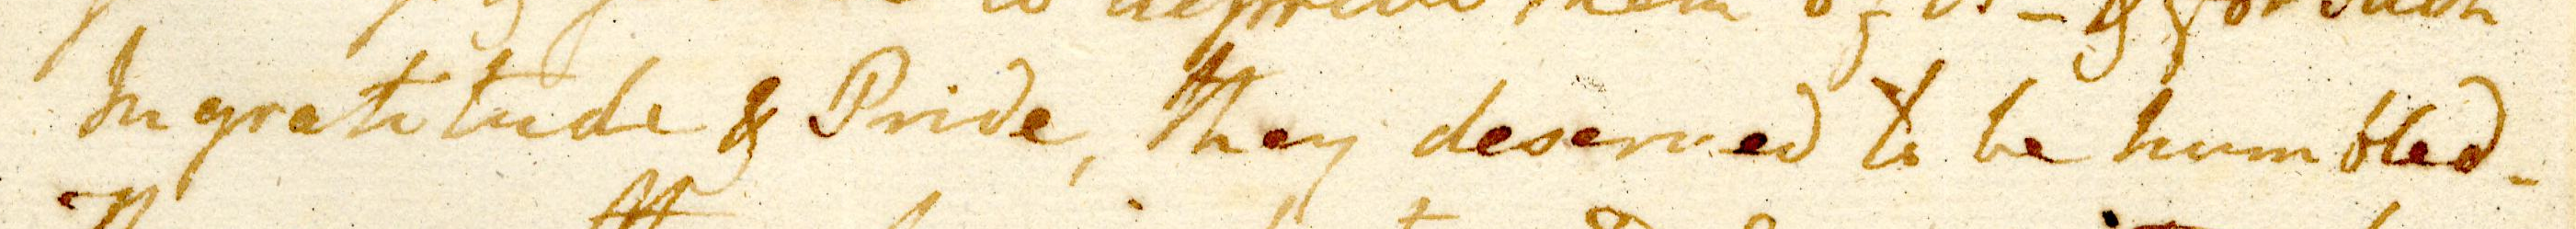Ingratitude & Pride, they deserved to be humbled.
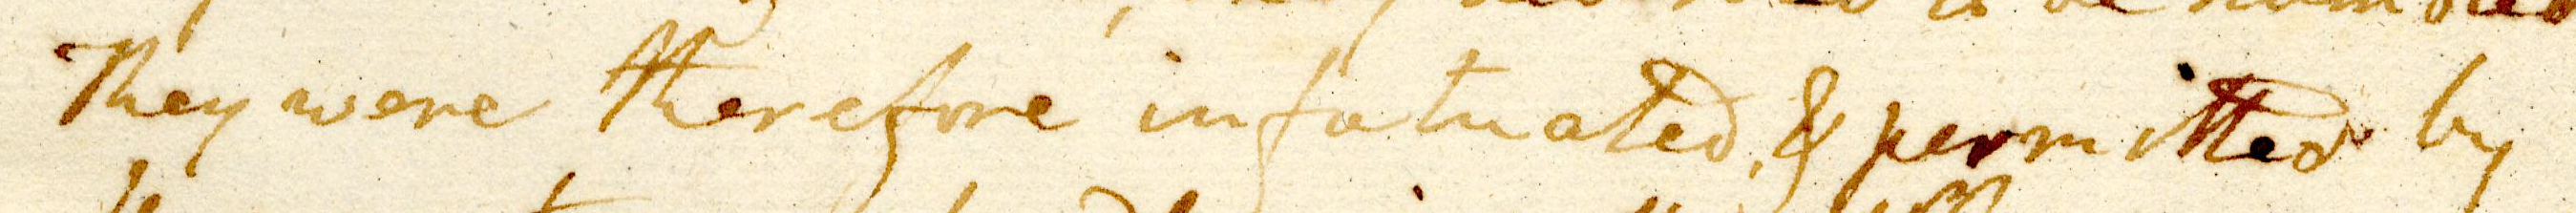They were therefore infatuated & permitted by
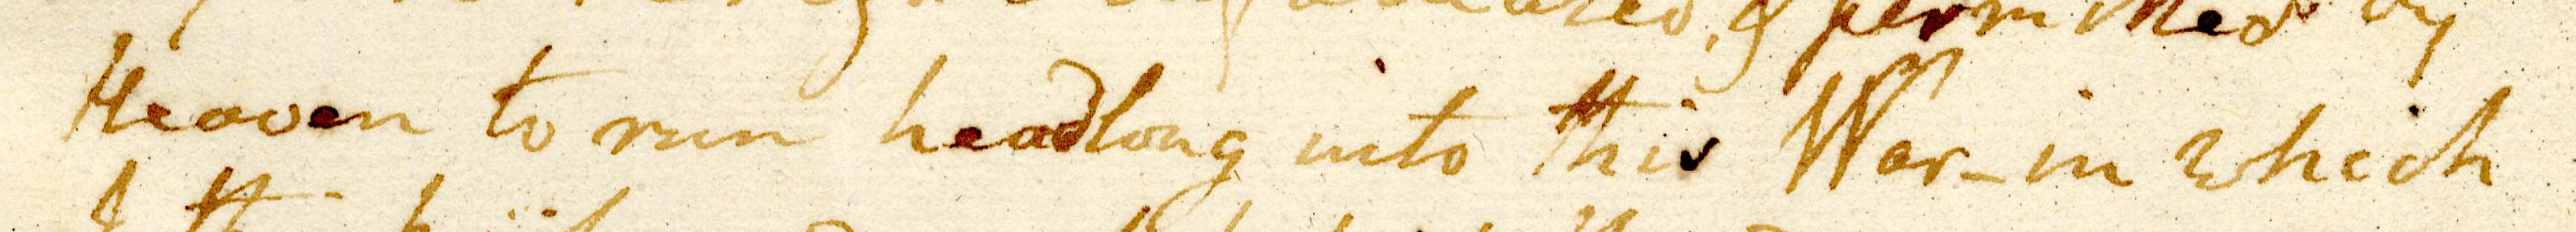Heaven to run headlong into this War- in which
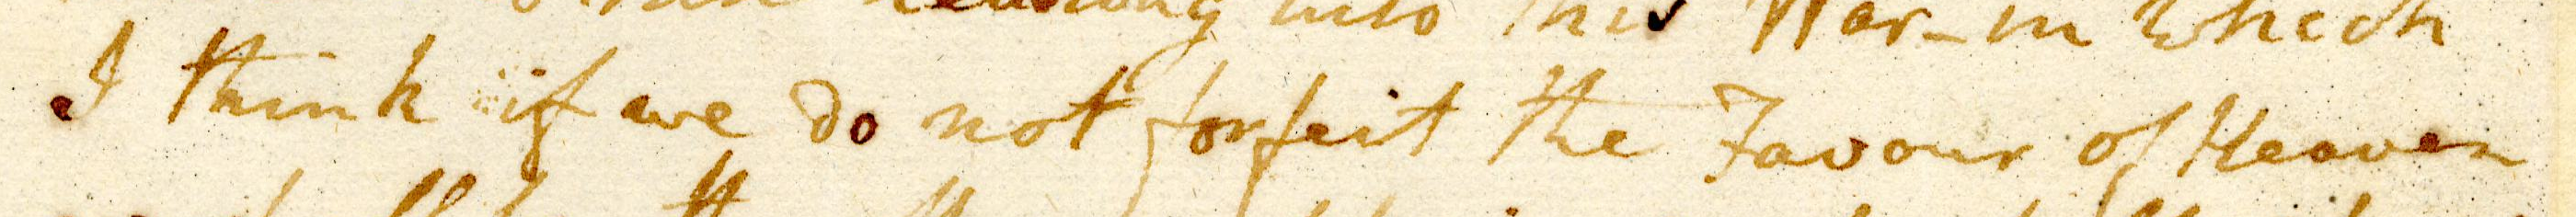I think if we do not forfeit the Favour of Heaven
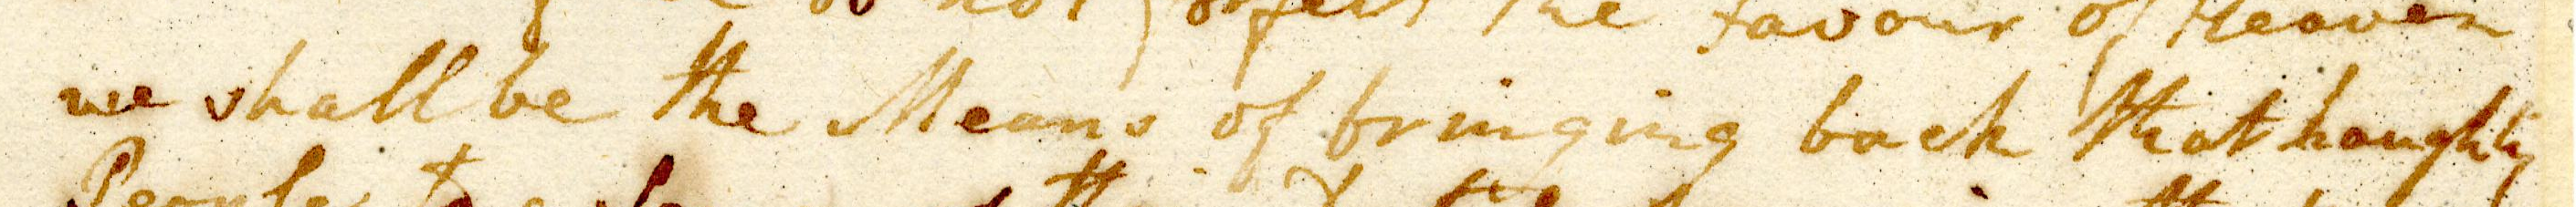we shall be the Means of bringing back that haughty
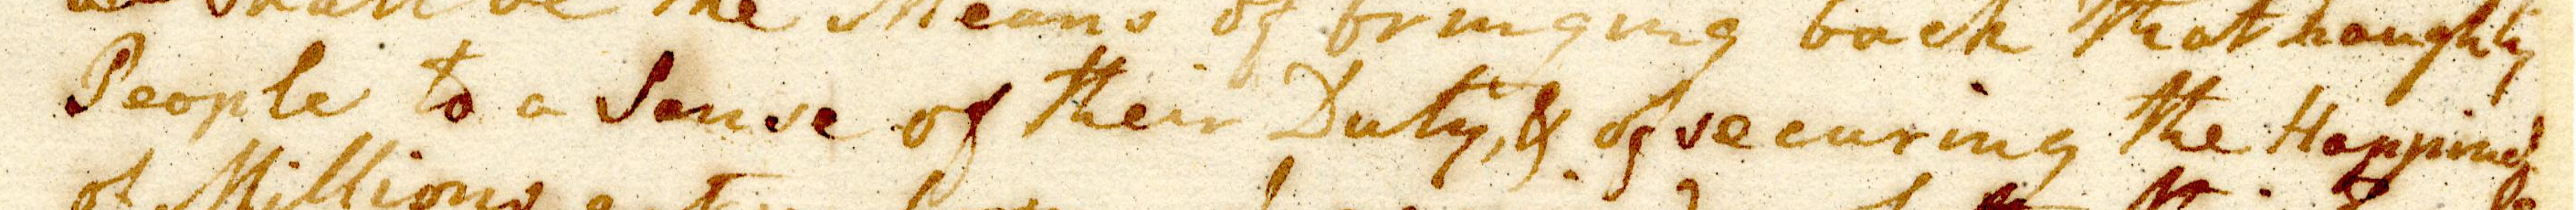People to a Sense of their Duty; & securing the Happiness
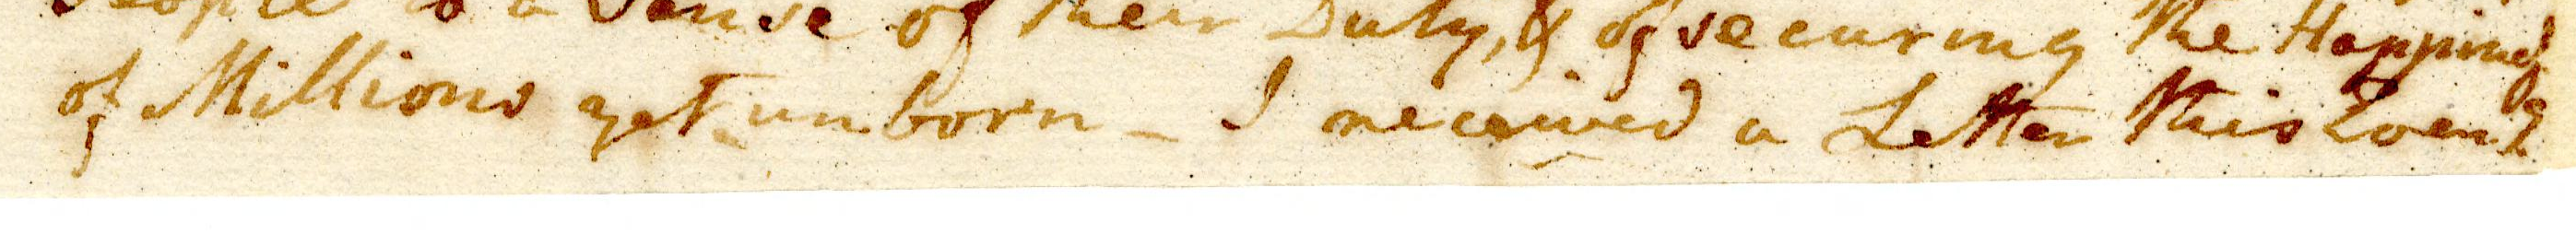of Millions yet unborn- I received a Letter this Even^g.
